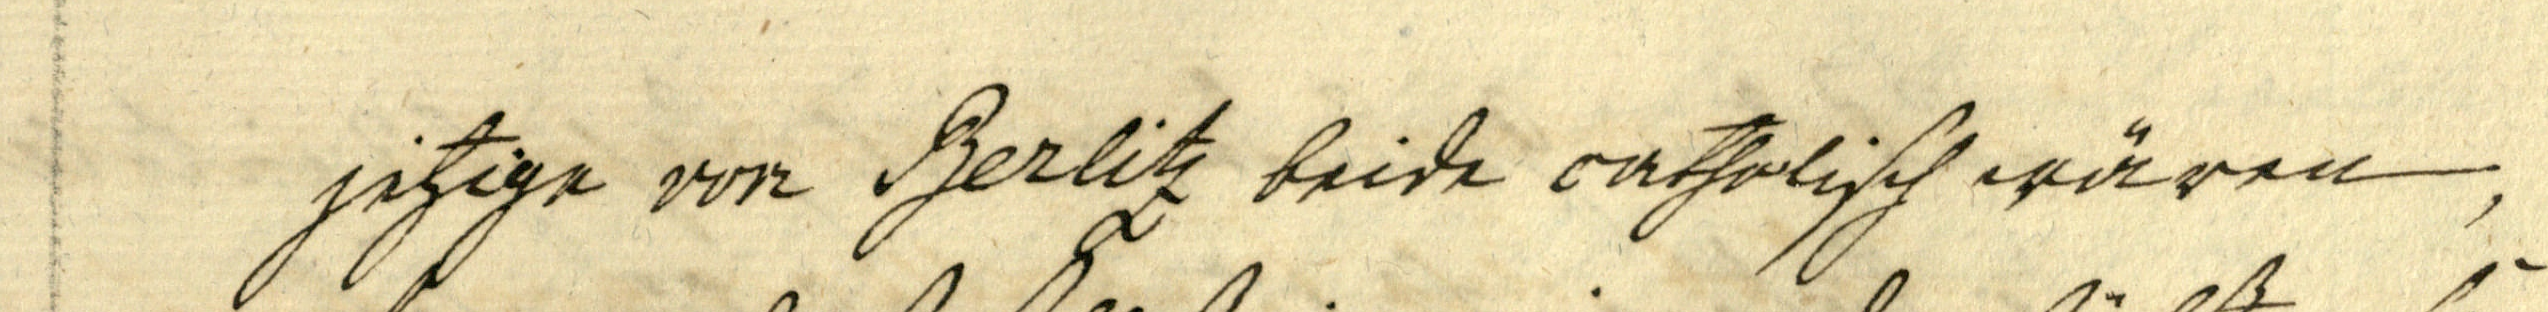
jetzige von Berlitz beide catholisch wären,
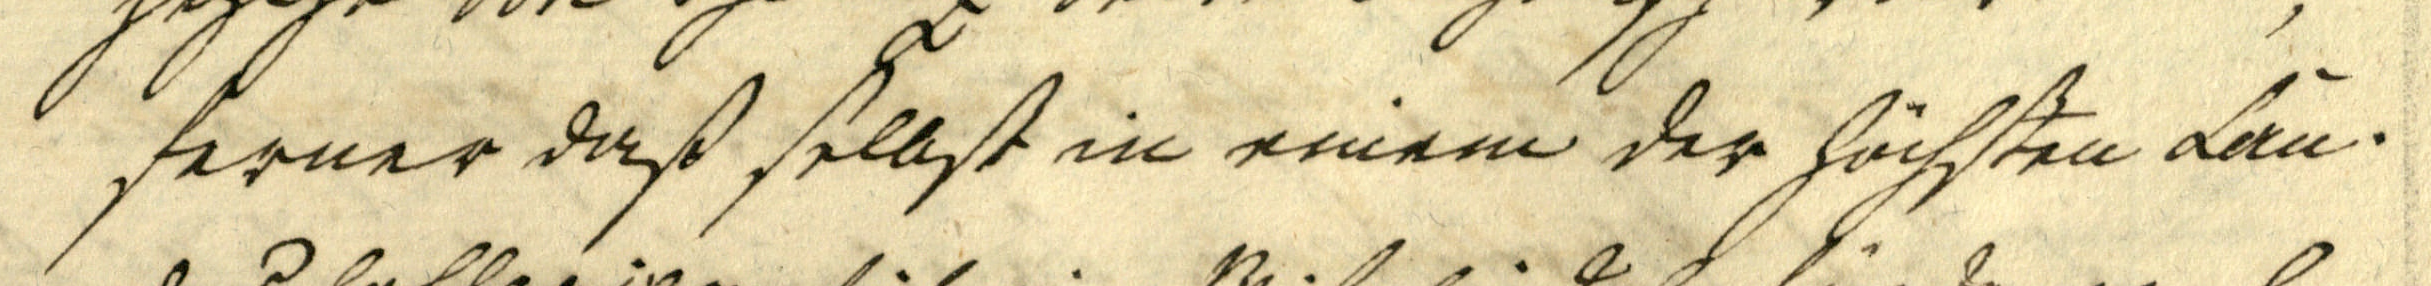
ferner daß selbst in einem der höchsten Lan¬
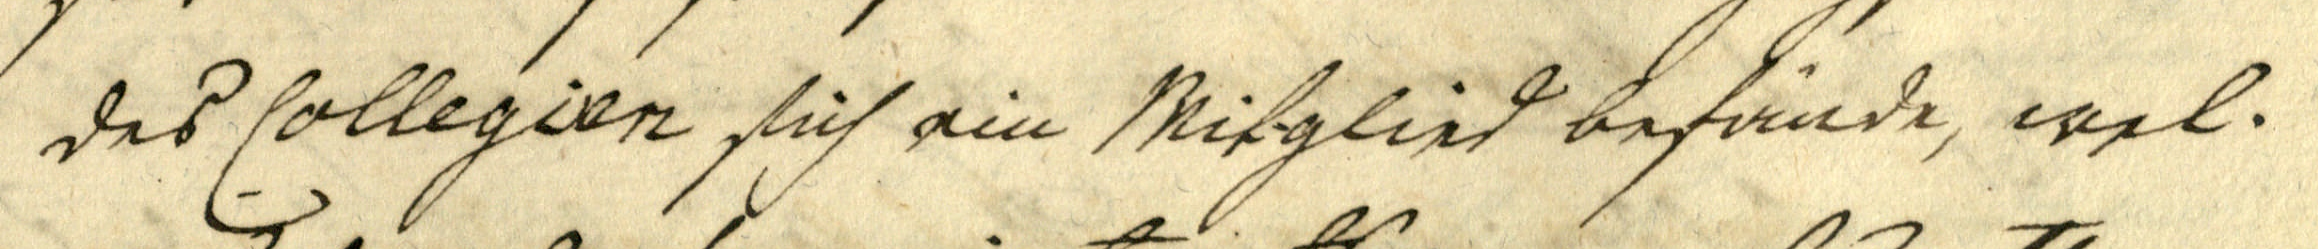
des Collegien sich ein Mitglied befände, wel¬
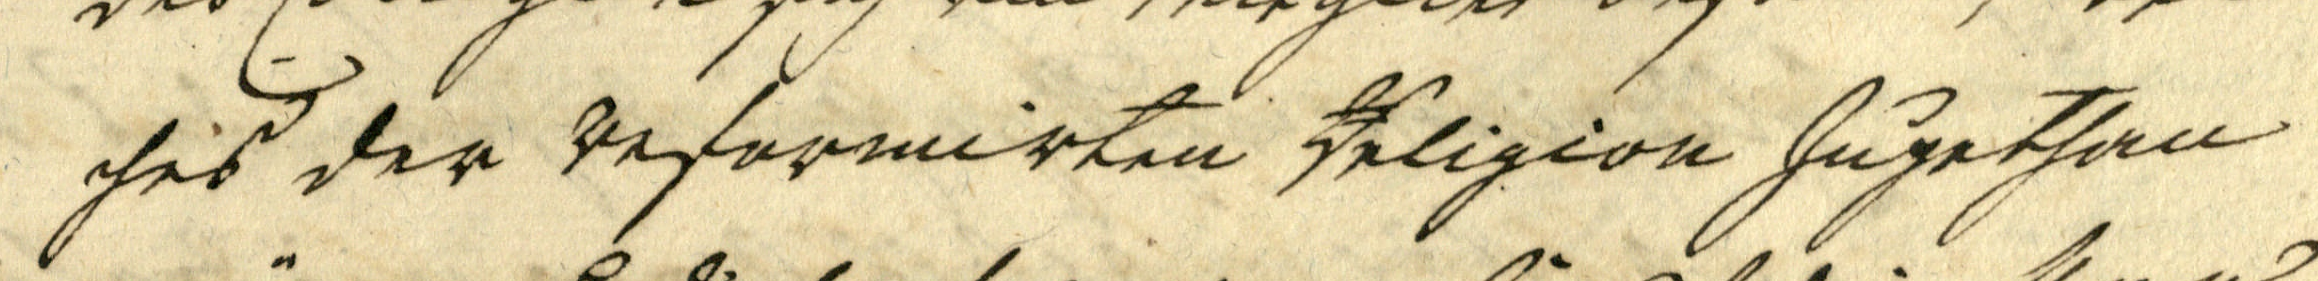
ches der reformirten Religion zugethan
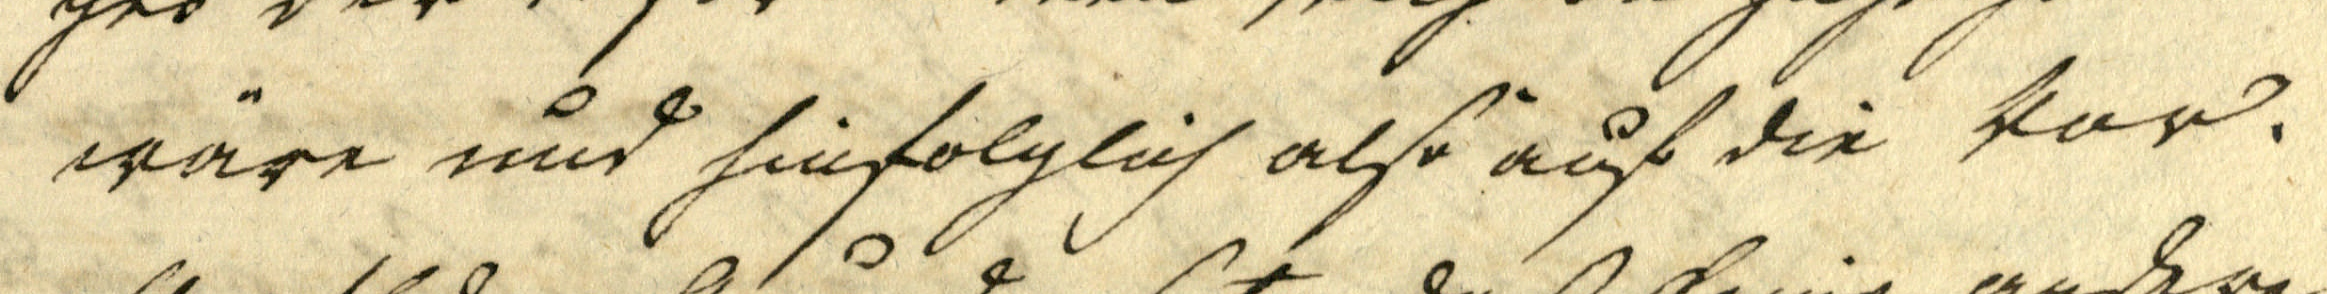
wäre und hinfolglich also auf die Vor¬
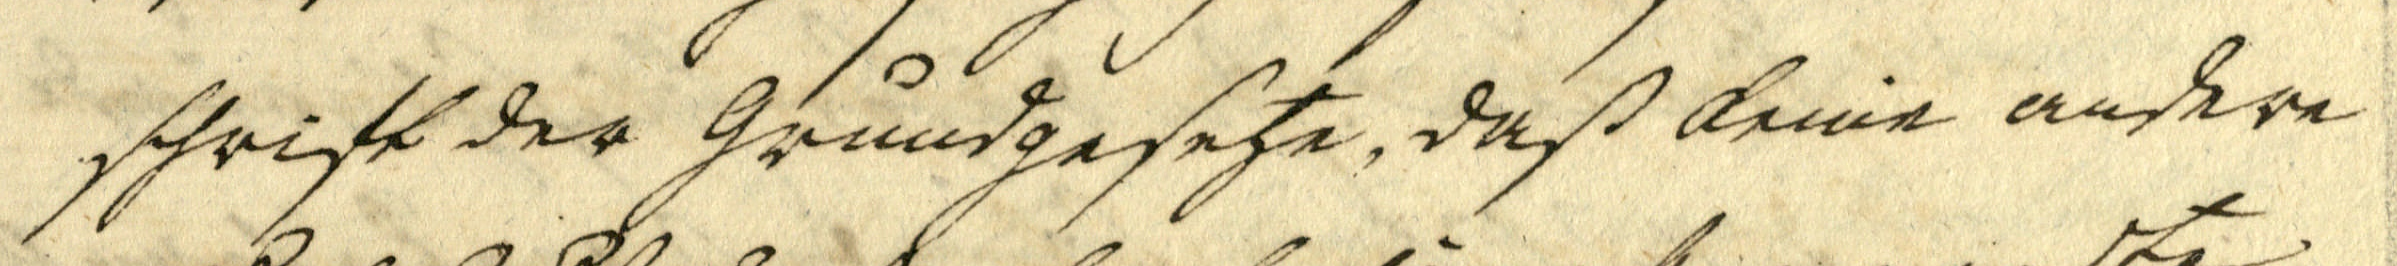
schrift der Grundgesetze, daß keine andere
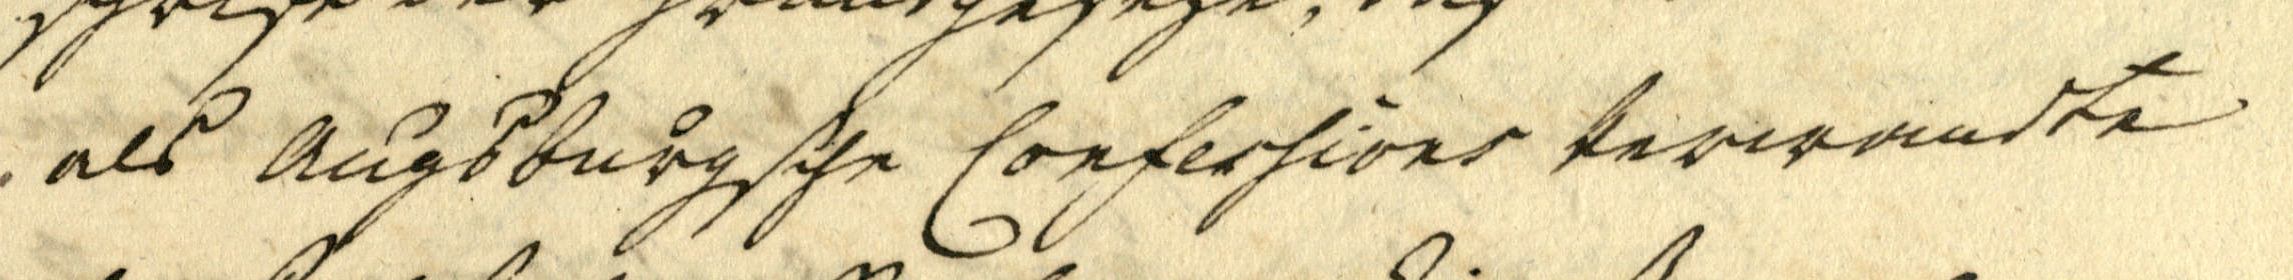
als Augsburgsche Confessions Verwandte
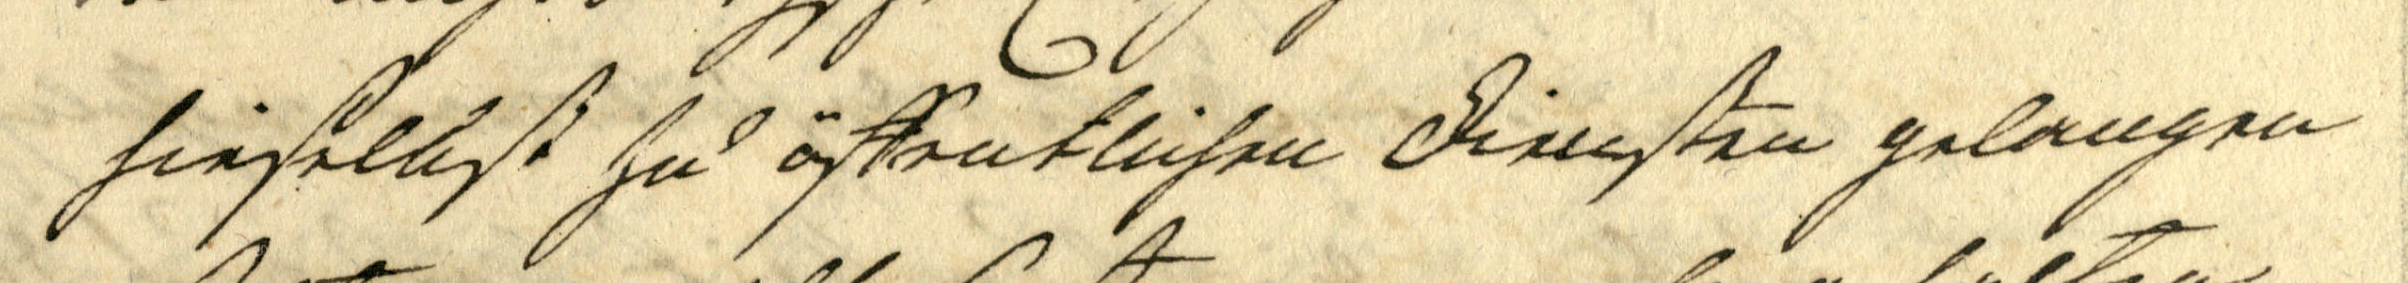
hieselbst zu öffentlichen Diensten gelangen
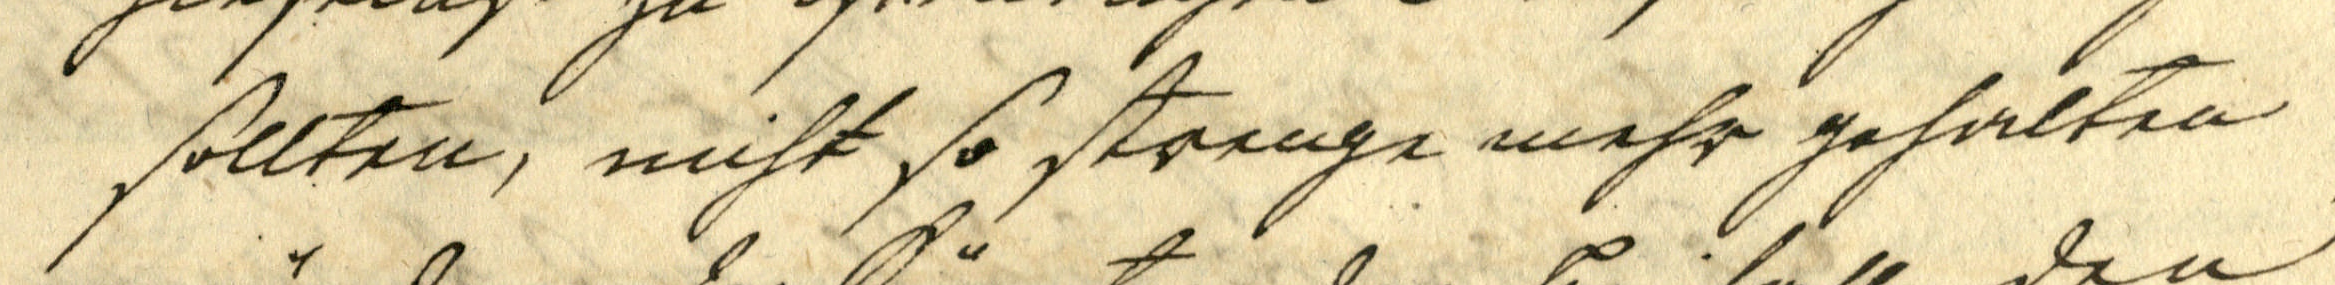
sollten, nicht so strenge mehr gehalten
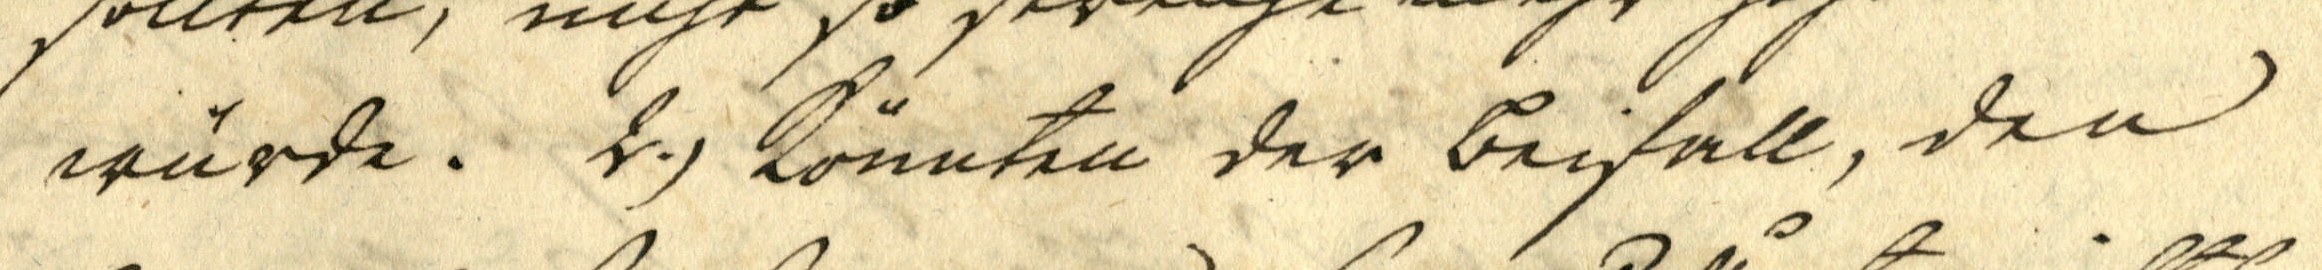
würde. 2., Könnten der Beifall, den
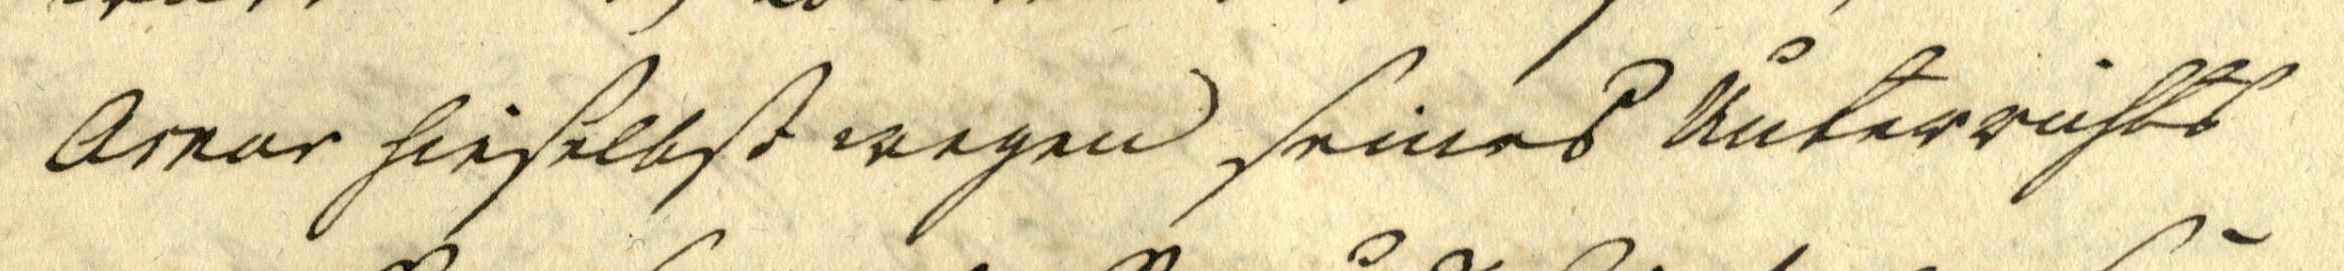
Amor hieselbst wegen seines Unterrichts
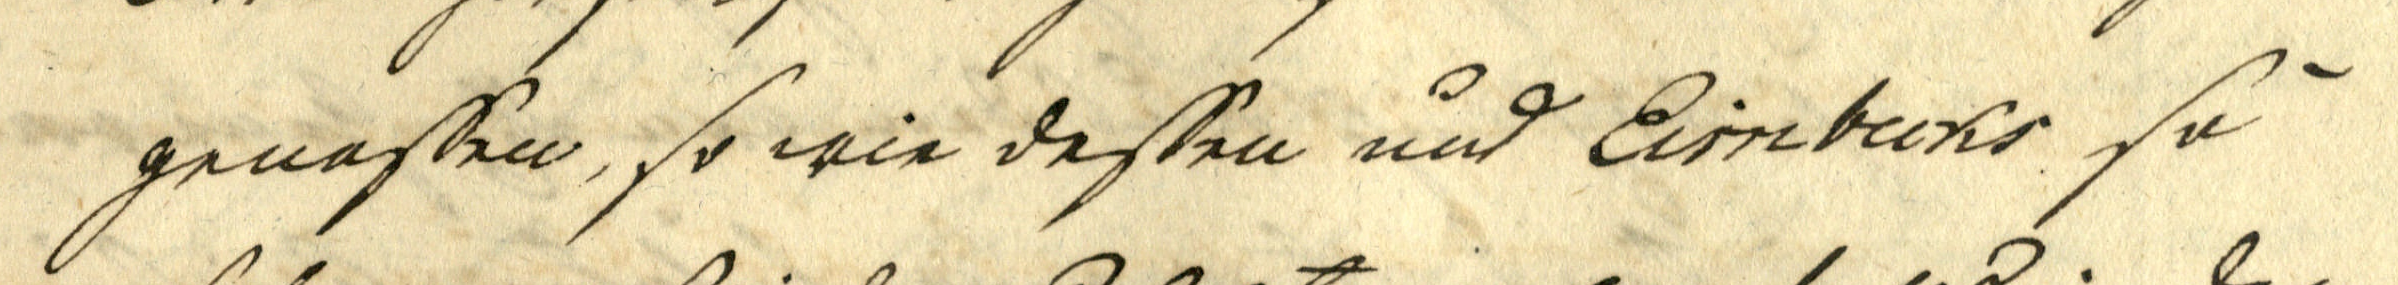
genossen, so wie dessen und Eimbecks so¬
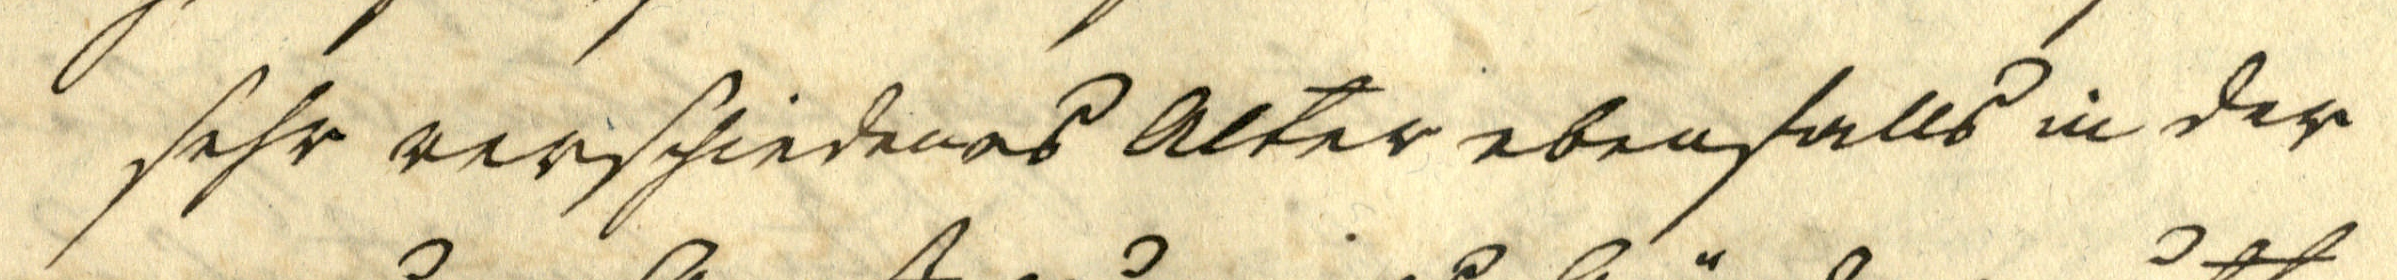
sehr verschiedenes Alter ebenfalls in der
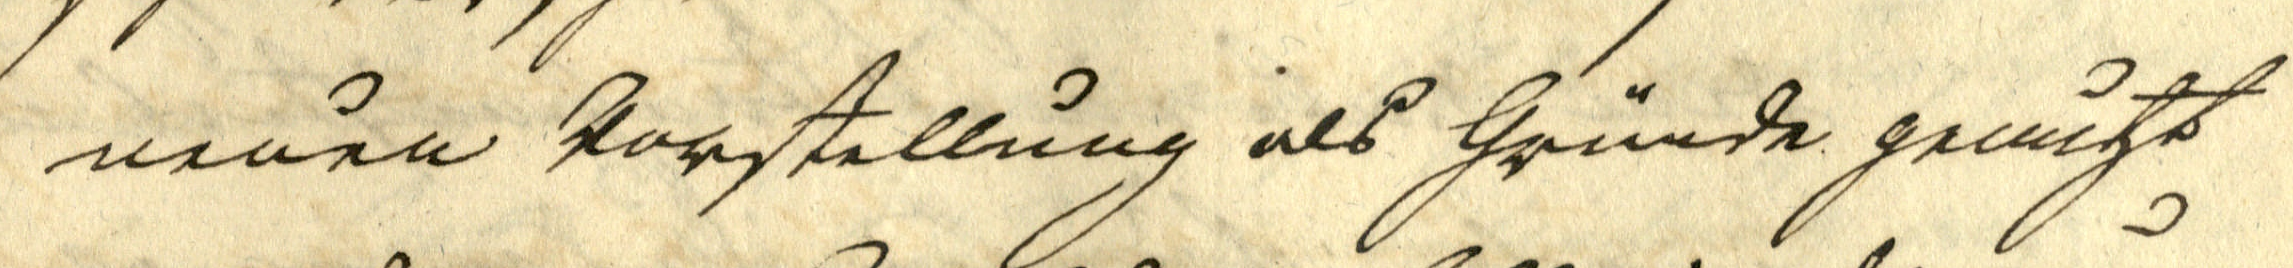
neuen Vorstellung als Gründe genutzt
